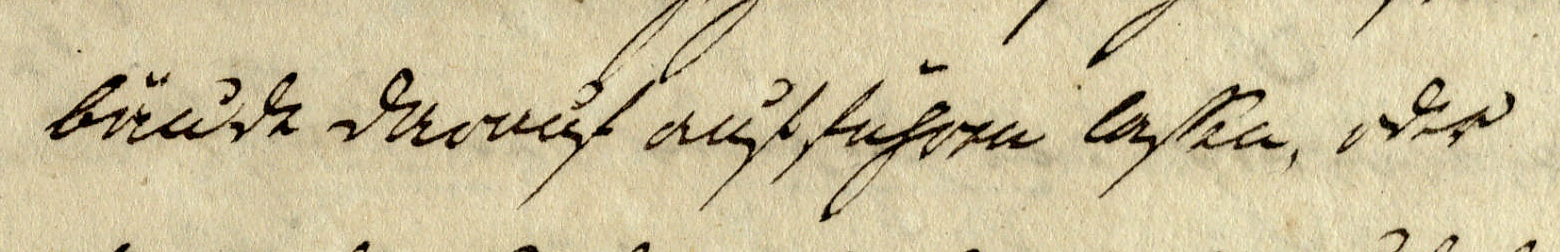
bäude darauf aufführen lassen, oder
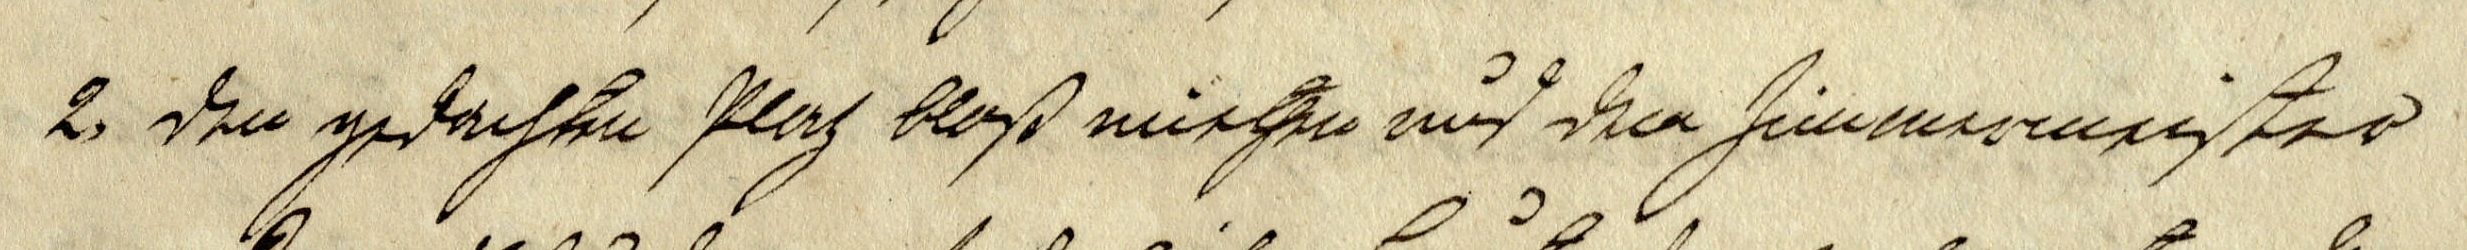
2. den gedachten Platz bloß miethen und dem Zimmermeister
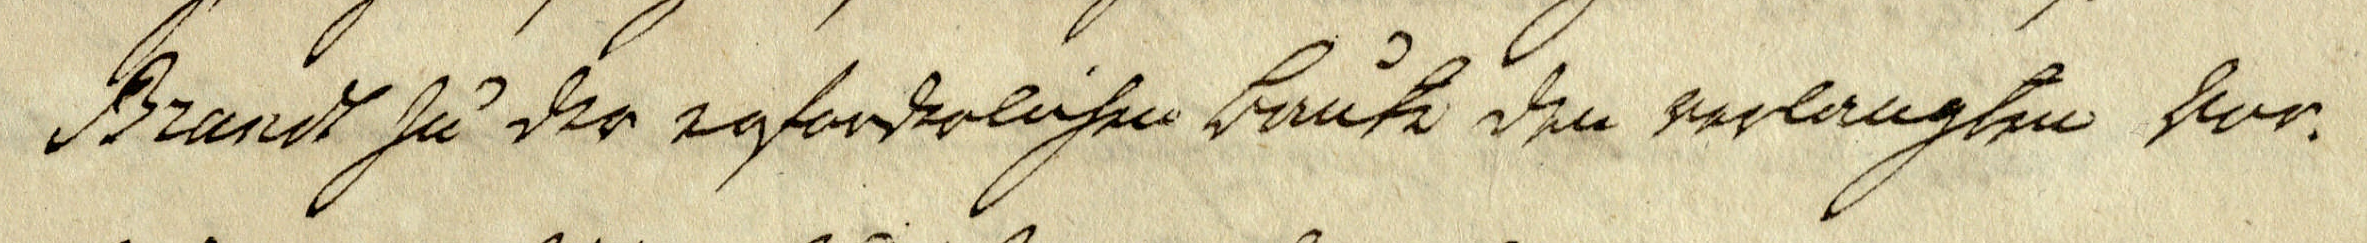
Brandt zu der erforderlichen Baute den verlangten Vor¬
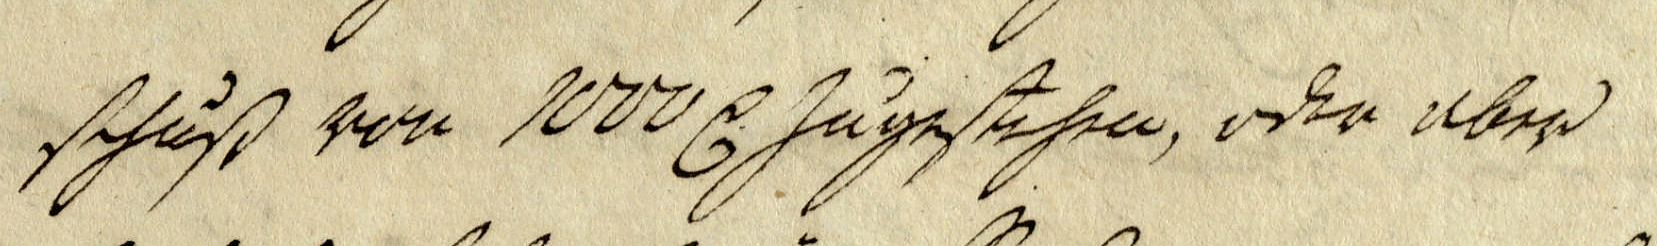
schuß von 1000 l. zugestehen, oder aber
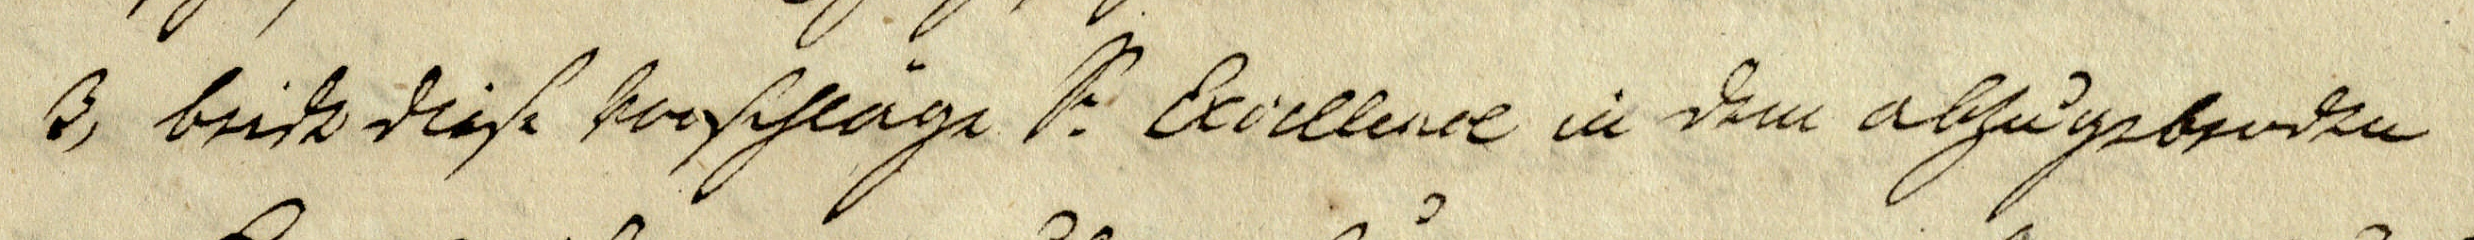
3, beide diese Vorschläge Sr Excellence in dem abzugebenden
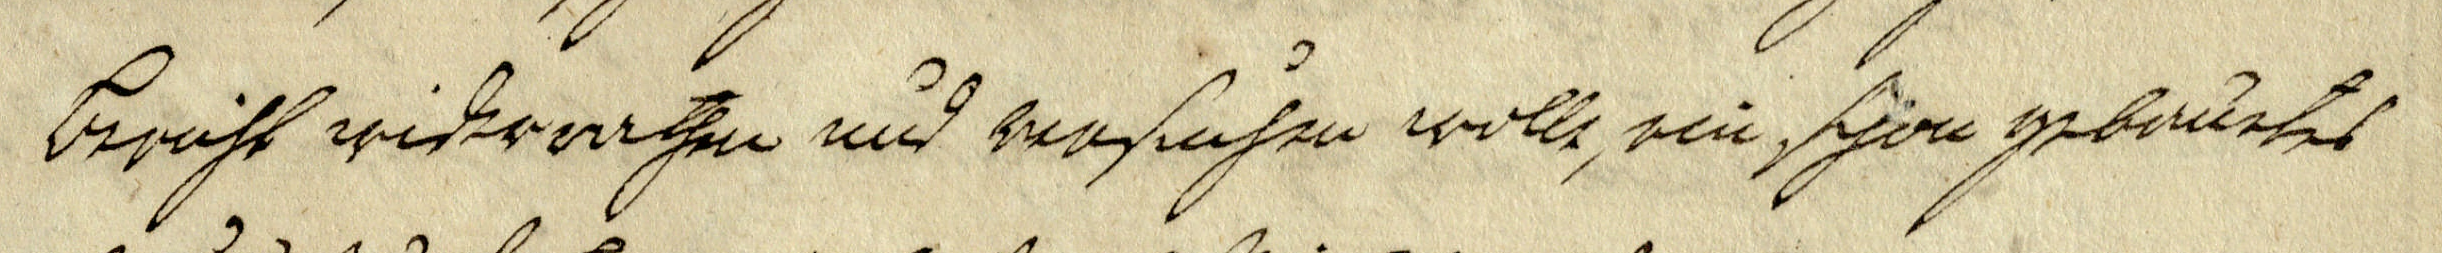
Bericht widerrathen und versuchen wolle, ein schon gebauetes
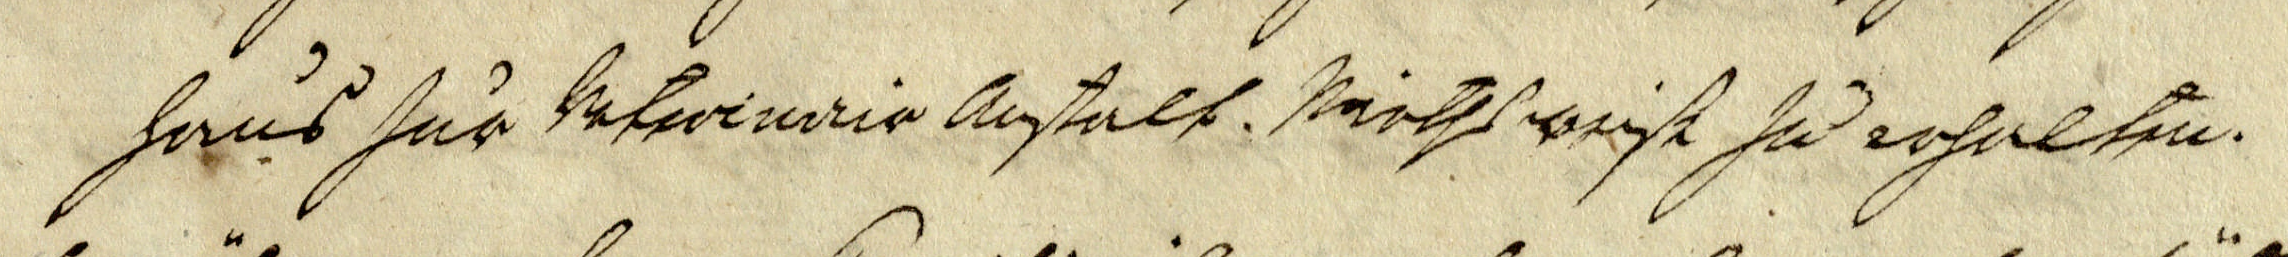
Haus zur Veterinair Anstalt. Miethsweise zu erhalten.
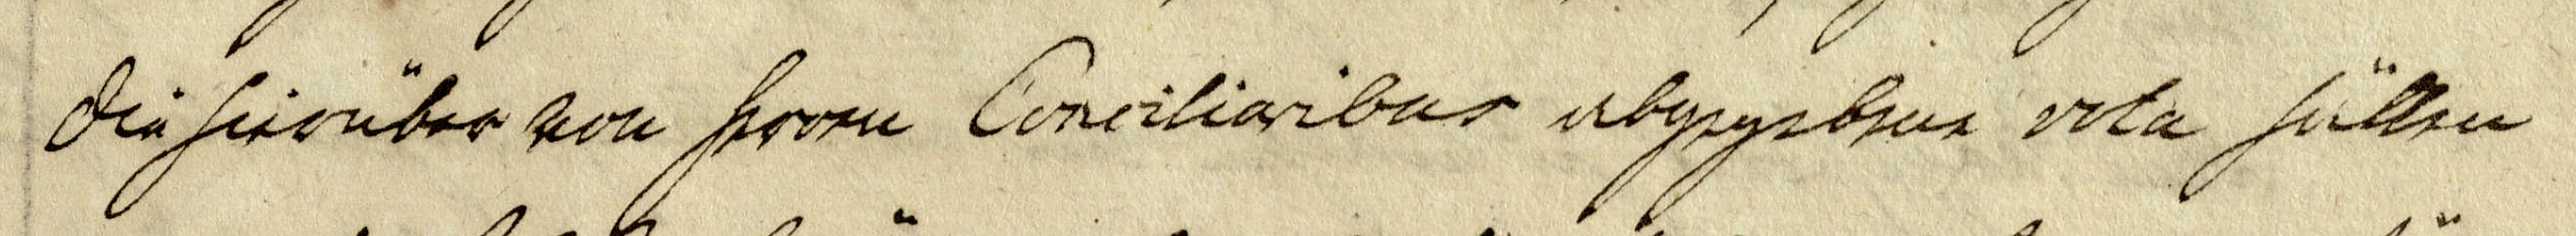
Die hierüber von Herren Conciliaribus abgegebene vota hätten
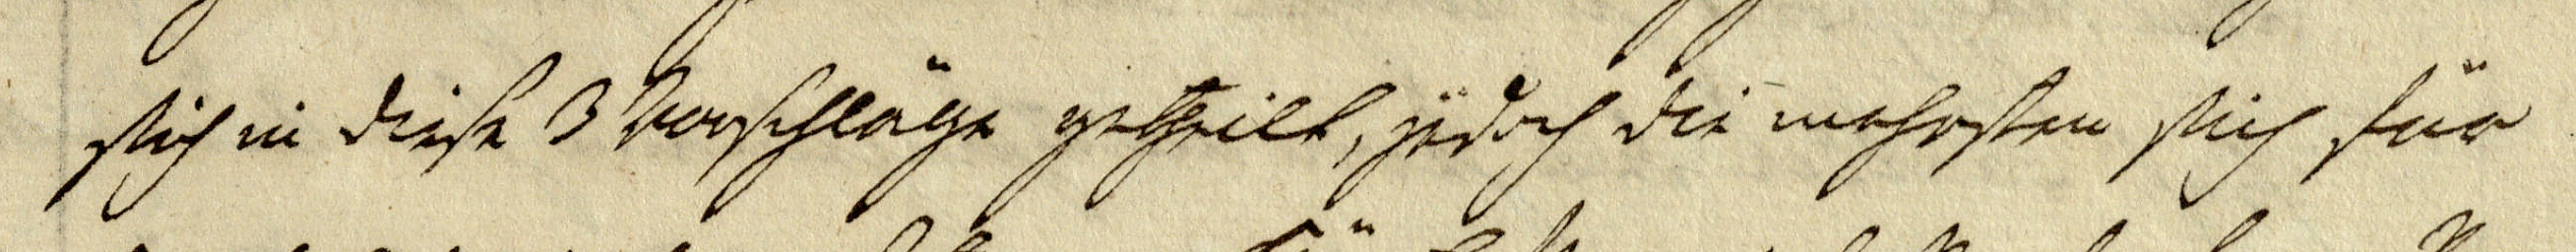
sich in diese 3 Vorschläge getheilt, jedoch die mehrsten sich für
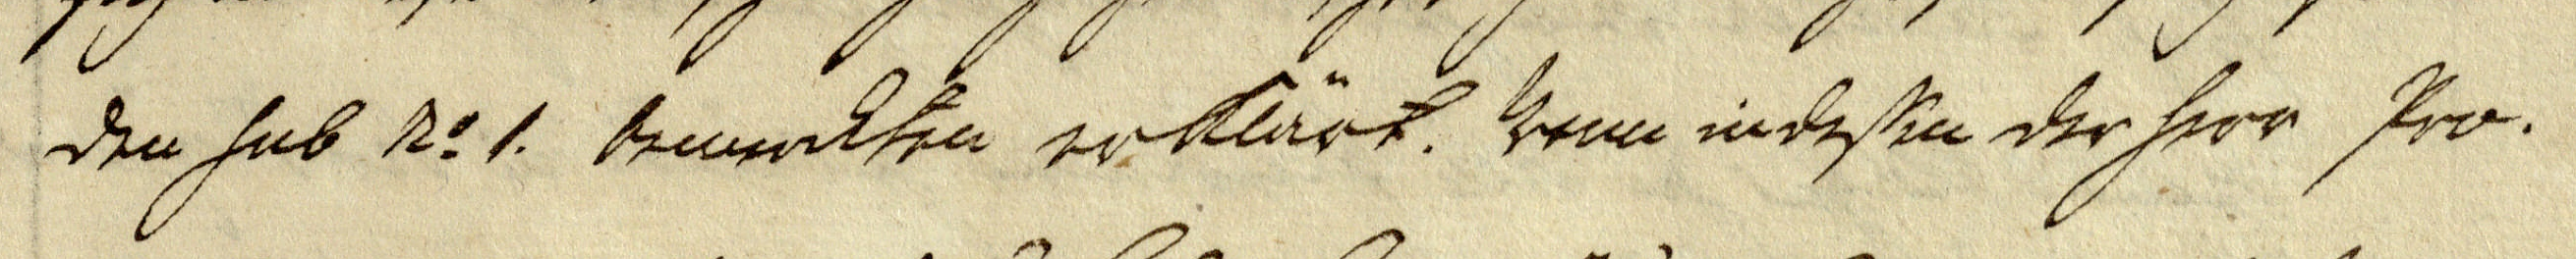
den sub No 1. bemerckten erklärt. Wenn indessen der Herr Pro¬
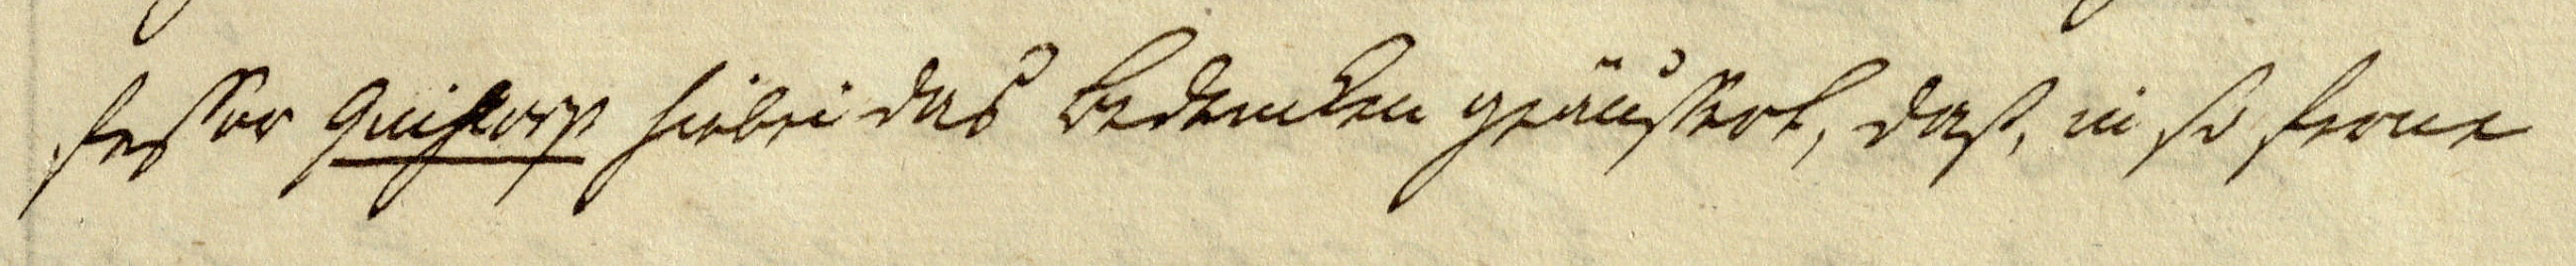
fessor Quistorp hiebei das Bedencken geäussert, daß, in so ferne
